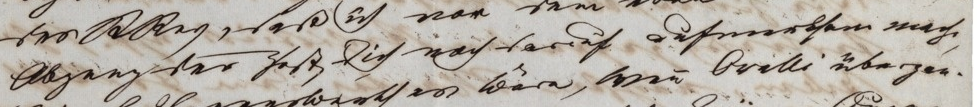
Abgang der Post, Dich noch darauf aufmerksam mache,
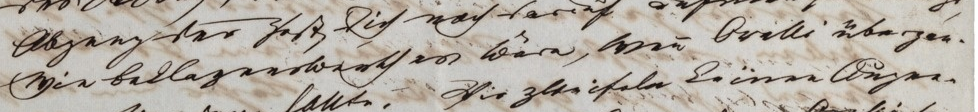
wie beklagenswerth es wäre, wenn Orelli übergan-
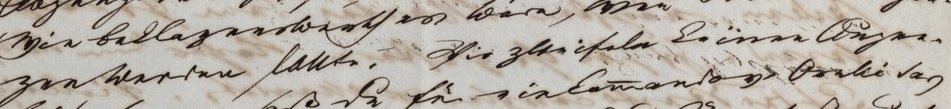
gen werden sollte. Wir zweifeln keinen Augen-
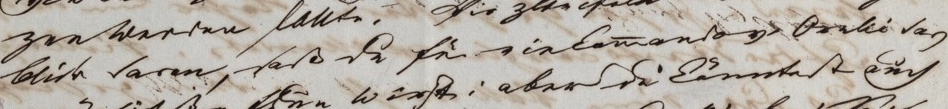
blick daran, daß Du für ein Commando v. Orelli das
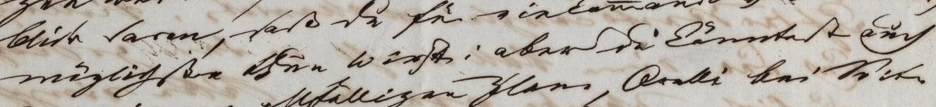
möglichste thun wirst: aber Du könntest auch
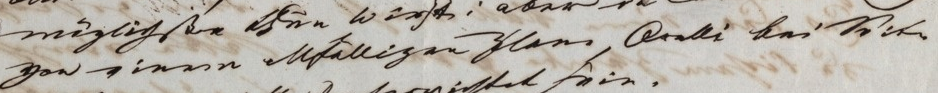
von einem allfälligen Plane, Orelli bei Seite
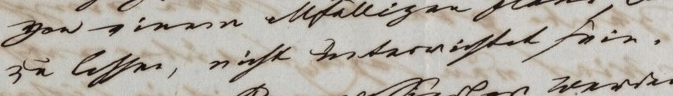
zu lassen, nicht unterrichtet sein.
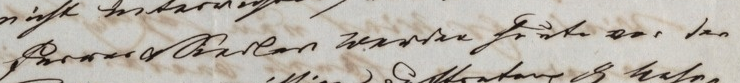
Furrer & Siedler werden heute vor der
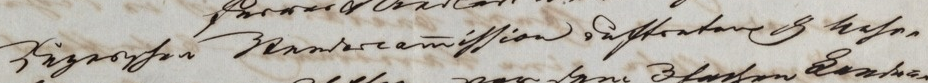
Zugerschen Standescommission auftreten & wahr-
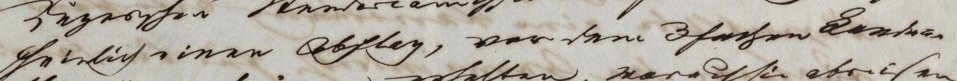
scheinlich einen Abschlag, vor dem 3fachen Landra-
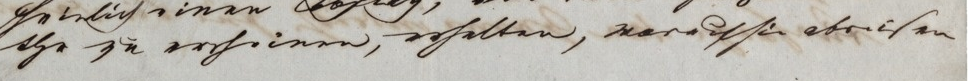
the zu erscheinen, erhalten, worauf sie abreisen
